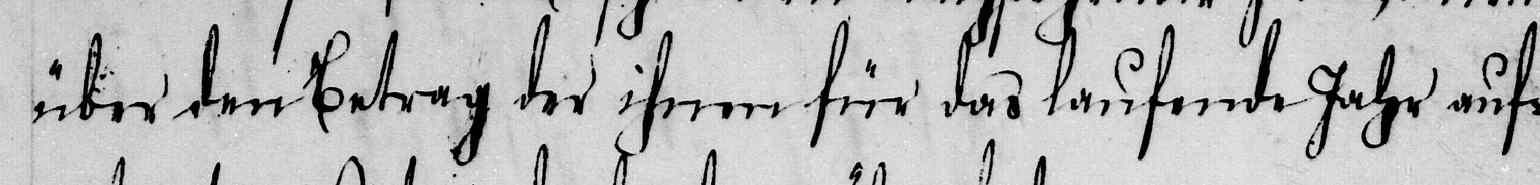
über den Betrag der ihnen für das laufende Jahr auf¬
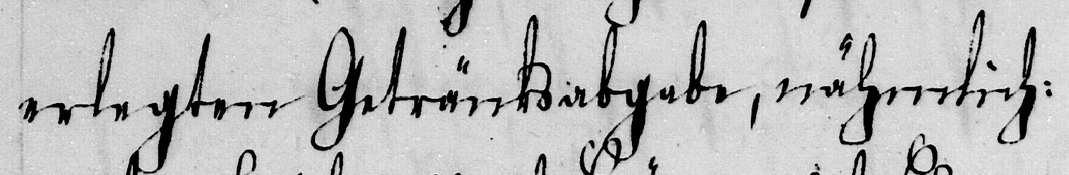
erlegten Getränksabgabe, nähmlich:
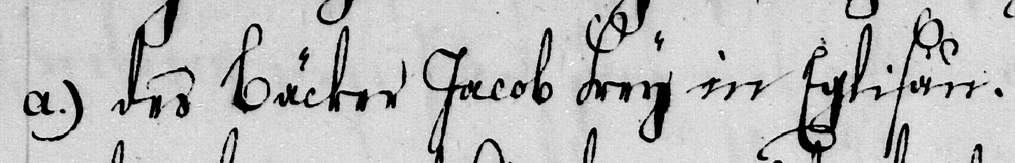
a.) des Bäcker Jacob Frey in Eglisau.
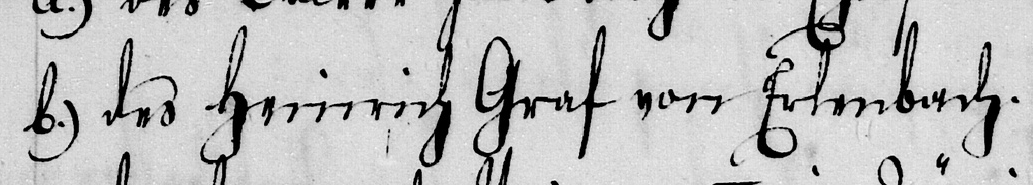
b.) des Heinrich Graf von Erlenbach.
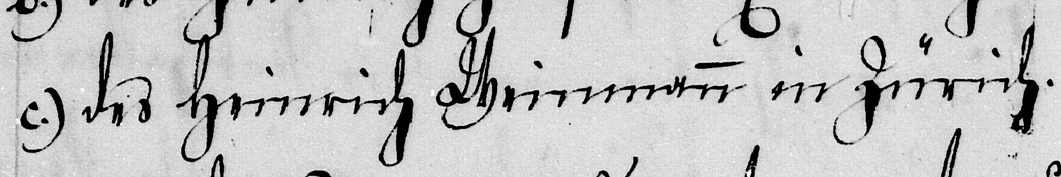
c.) des Heinrich Weinmann in Zürich.
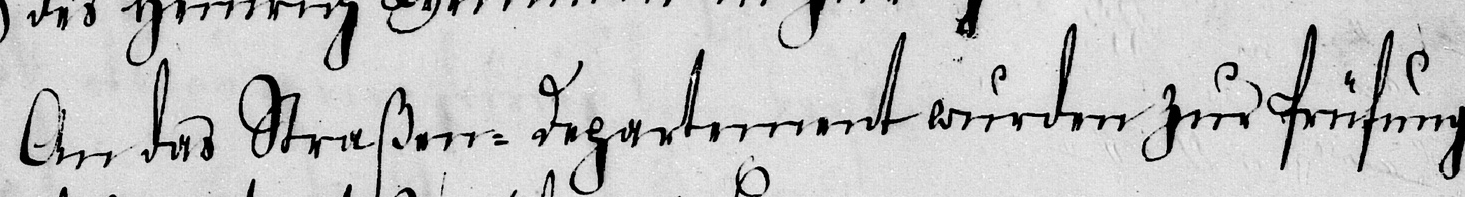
An das Straßen-Dapartement wurde zur Prüfung
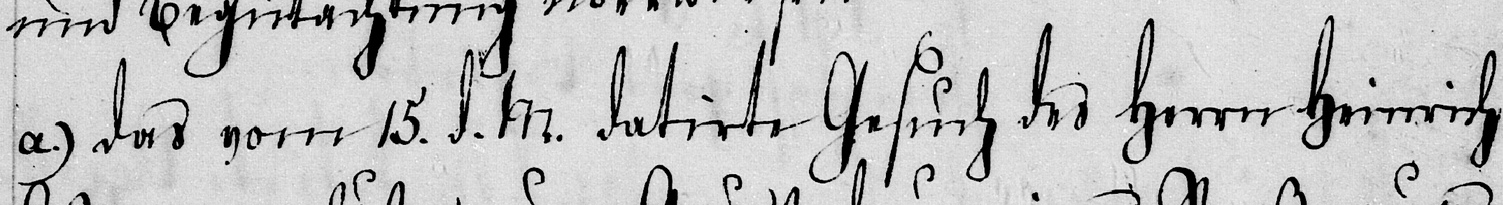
a.) das vom 15. d. M. datirte Gesuch des Herrn Heinrich
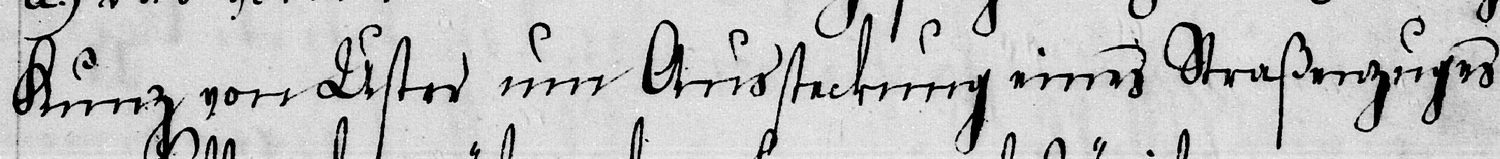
Kunz von Uster um Aussteckung eines Straßenzuges
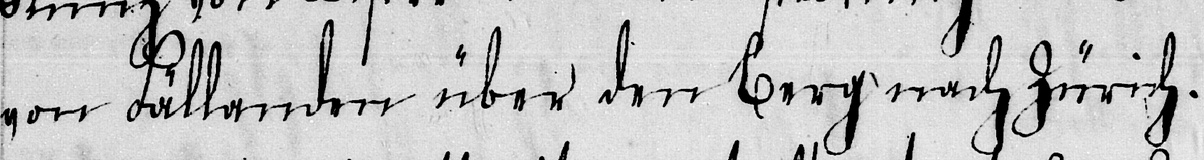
von Fällanden über den Berg nach Zürich.
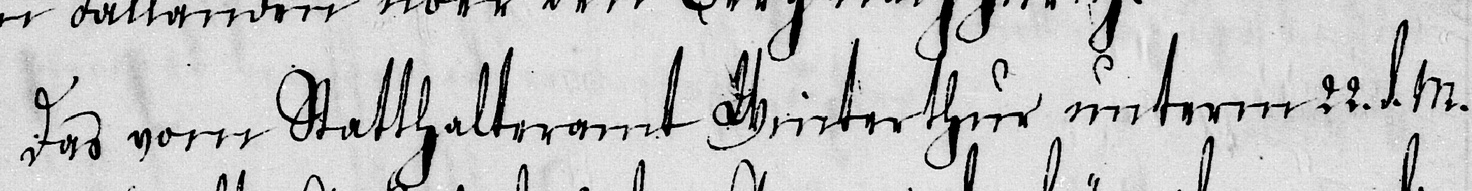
Das vom Statthalteramt Winterthur unterm 22. d. M.
